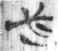必
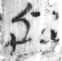兵
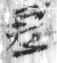是
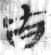古（故）
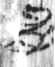{胃刀}（謂）
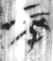不
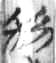利（利）
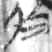於
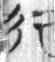行
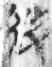{尸拃}（作）
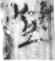埜（野）
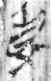事
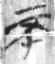不
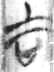吉
